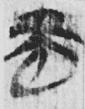而
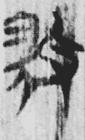{𡵂攴}（美）
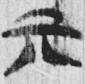亓（其）
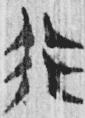行
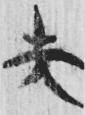○（堯）
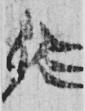於
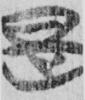是
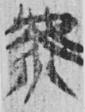{虍介}（乎）
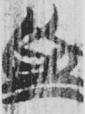爲
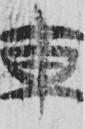車
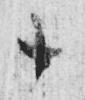十
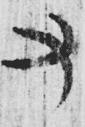又（有）
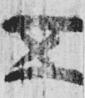五
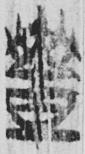𨌤
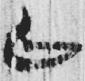㠯（以）
